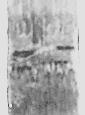二
